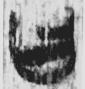曰
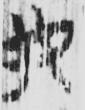四
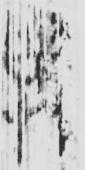與
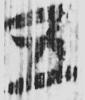五
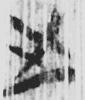之
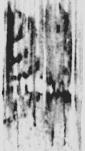○（間）
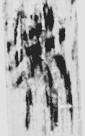{虍介}（乎）
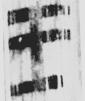王
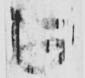曰
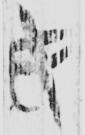女（如）
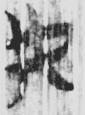四
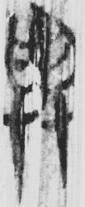與
